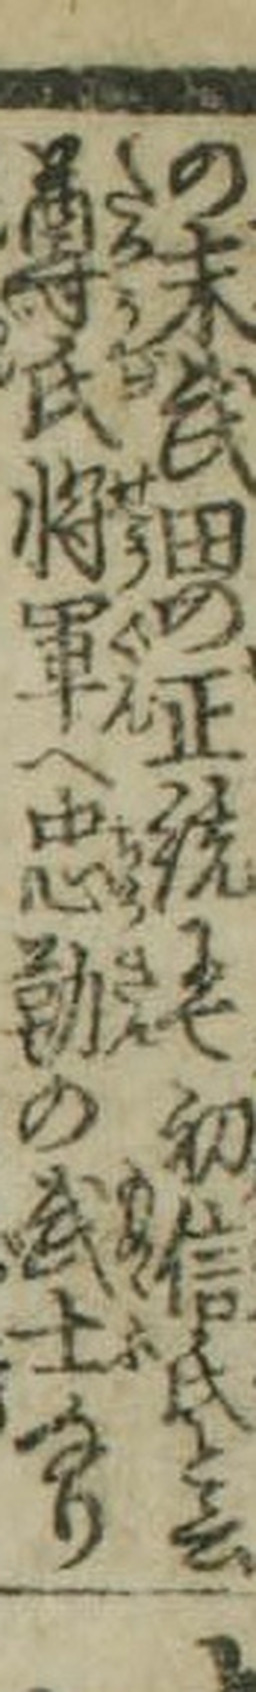尊氏将軍へ忠勤の武士なり
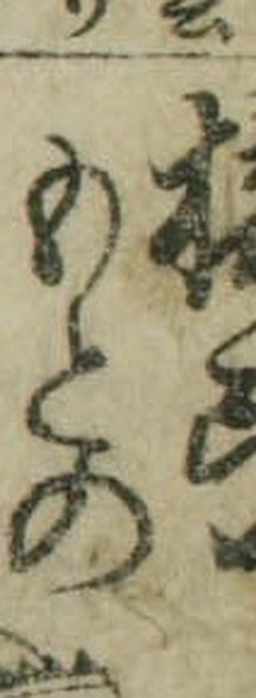もとの
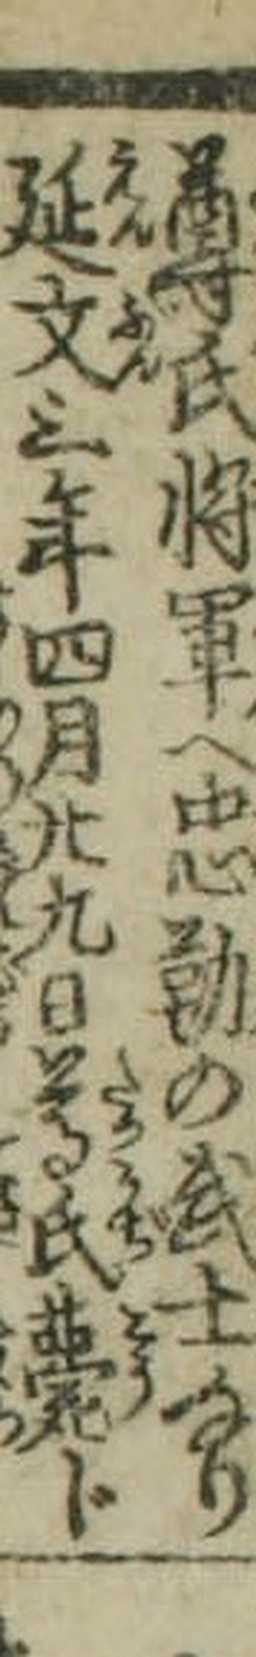延文三年四月廿九日尊氏薨じ
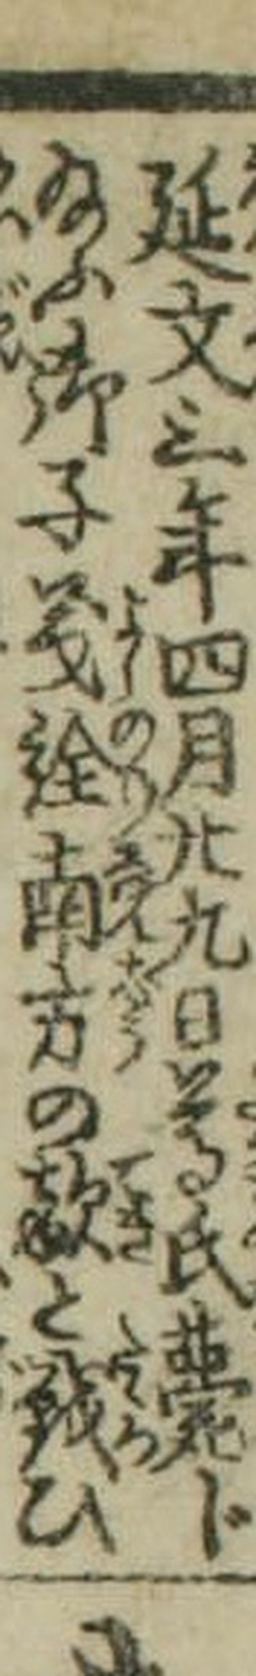給ふ御子義詮南方の敵と戦ひ
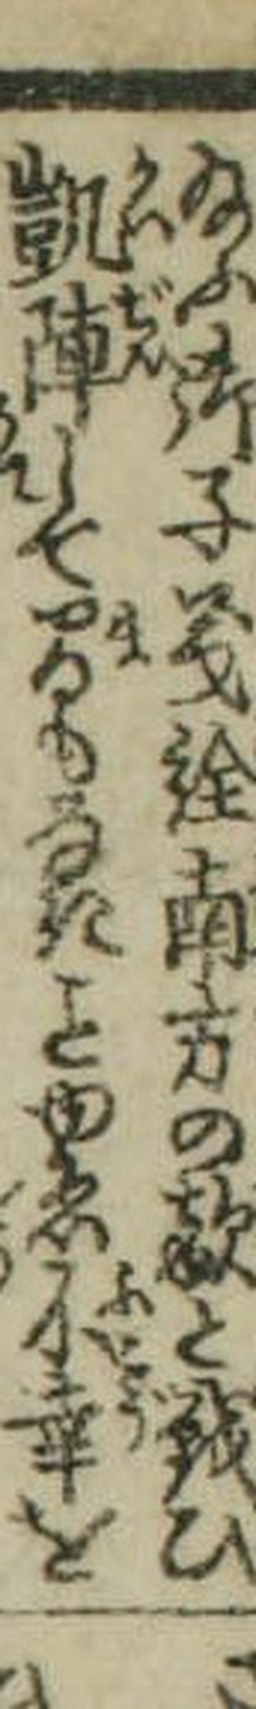凱陣して間もなきことゆゑ不幸を
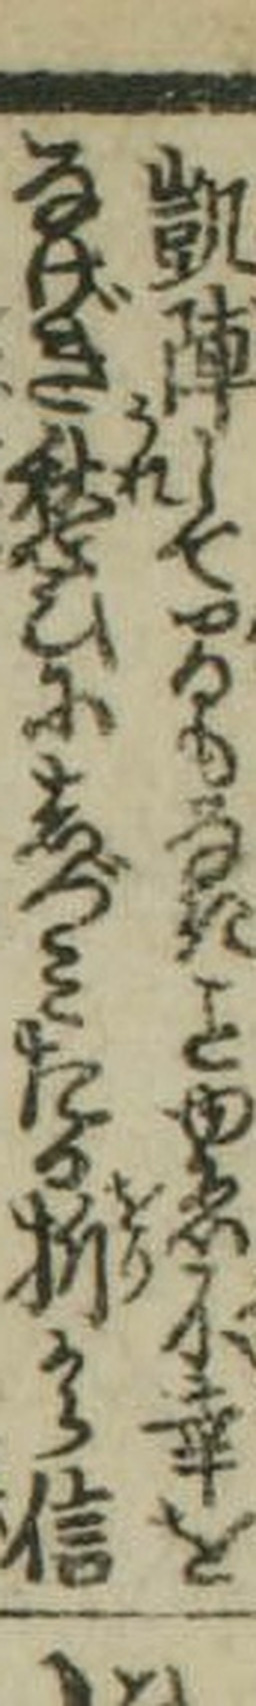なげき愁ひにしづみたる折から信
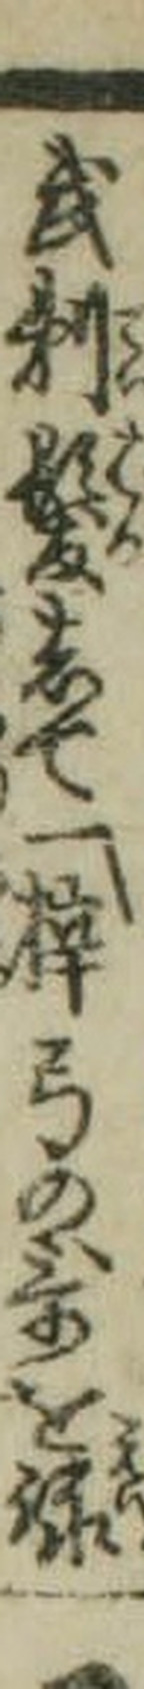武剃髪して〽梓弓の哥を詠
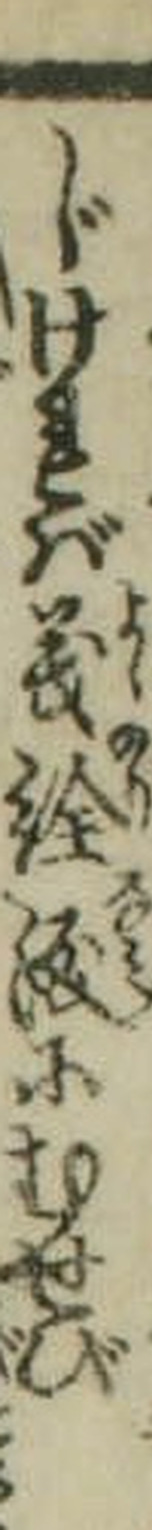じければ義詮涙にむせび
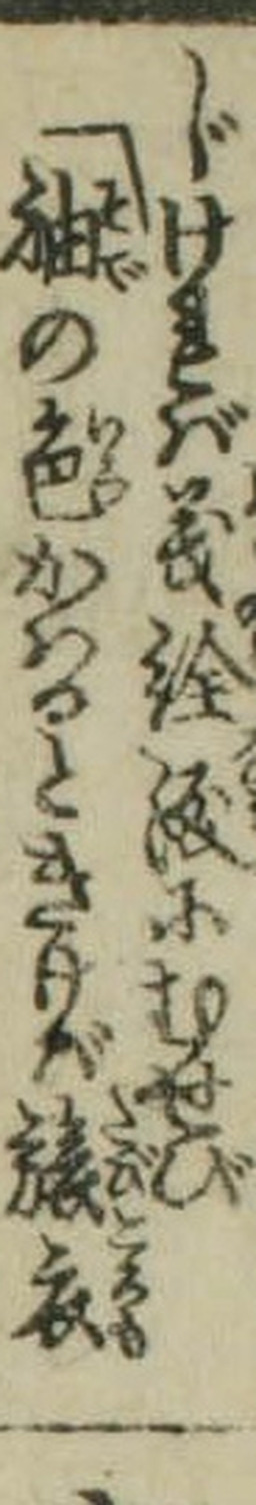〽袖の色かはるときけば旅衣
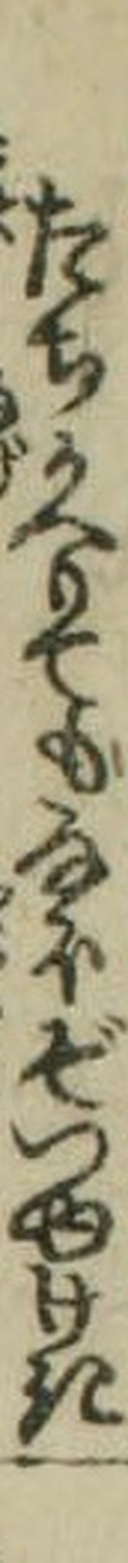たちかへりてもなほぞつやけき
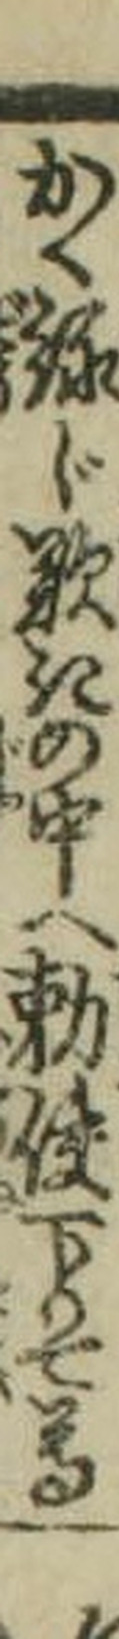かく詠じ歎きの中へ勅使下りて尊
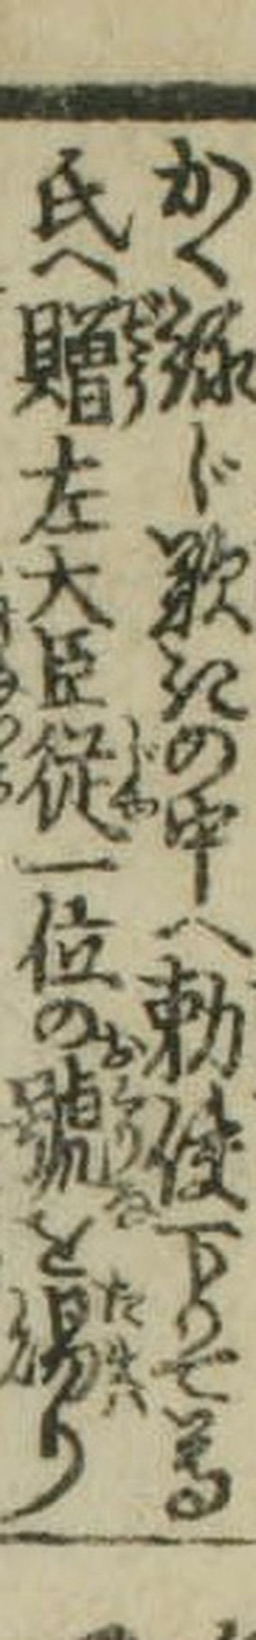氏へ贈左大臣従一位の號を賜り
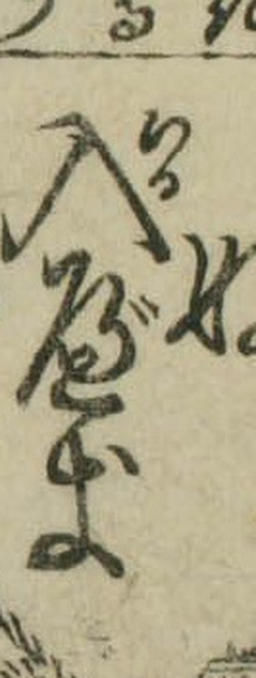入べき
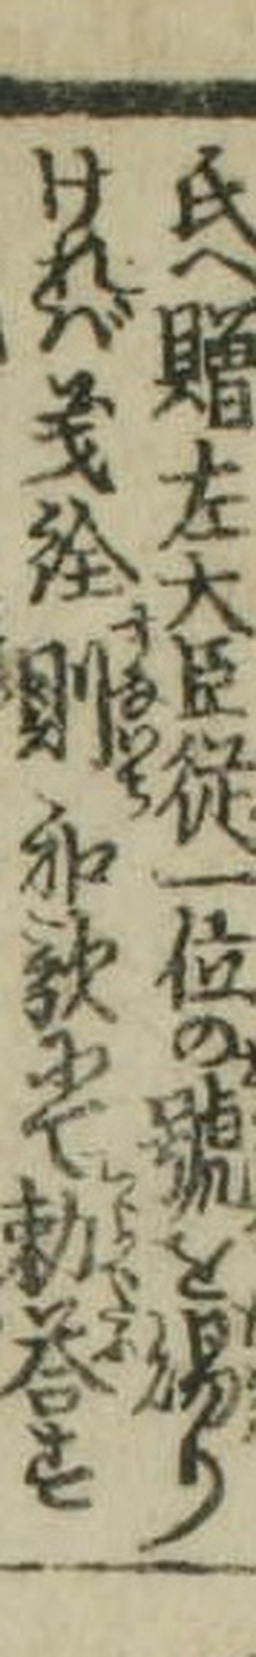ければ義詮則和歌にて勅答す
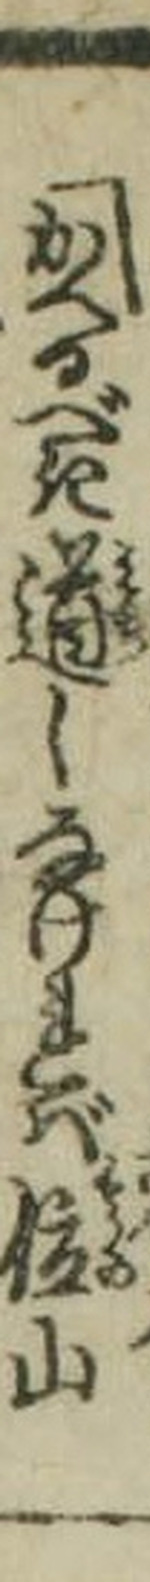〽かへるべき道しなければ位山
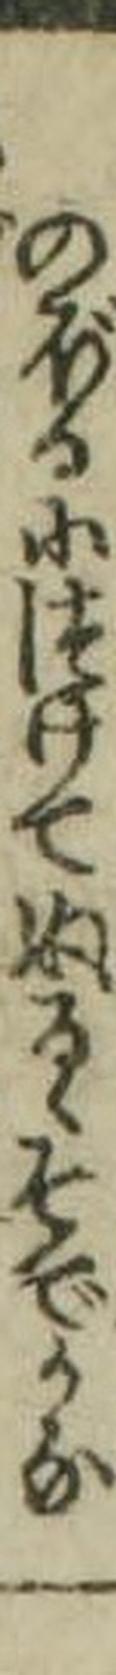のぼるにつけてぬるゝそでかな
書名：續英雄百人一首
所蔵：東京学芸大学附属図書館
